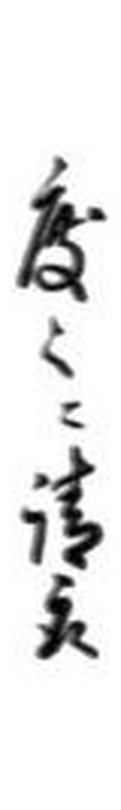度々ニ請取
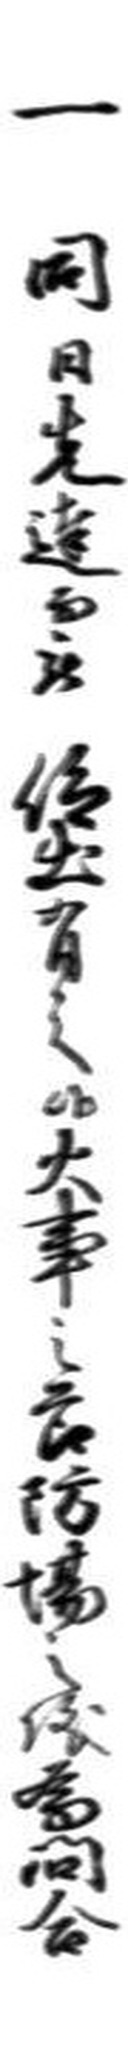一同日先達而被仰出有之候火事之節防場之儀為問合
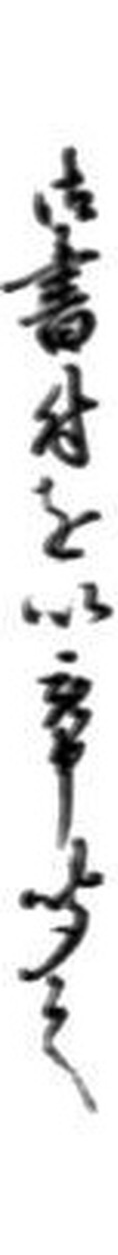御書付を以被申聞之

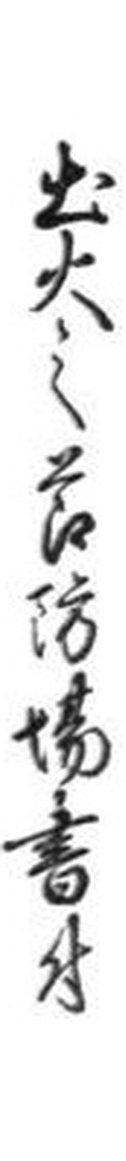出火之節防場書付
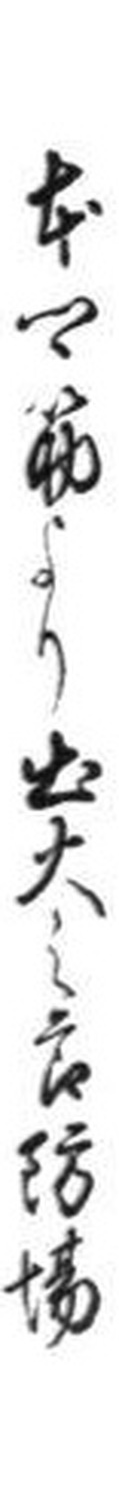本郷筋より出火之節防場
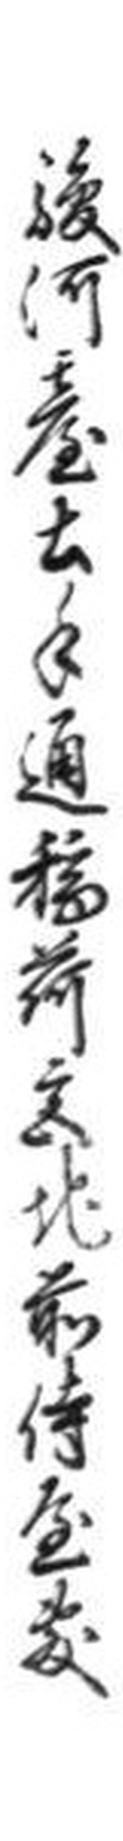駿河台土手通稲荷宮地前侍屋敷
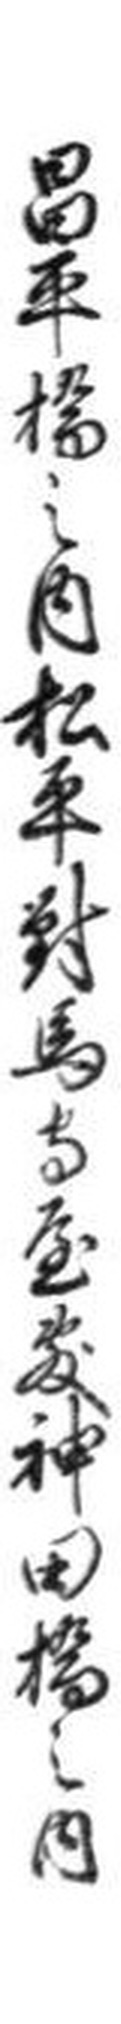昌平橋之内松平対馬守屋敷神田橋之内
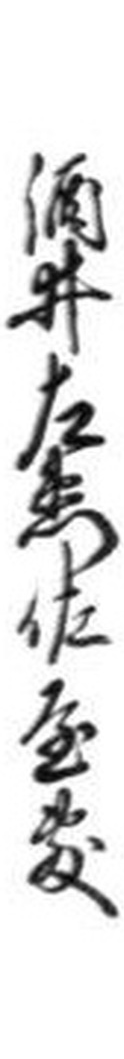酒井左衛門佐屋敷
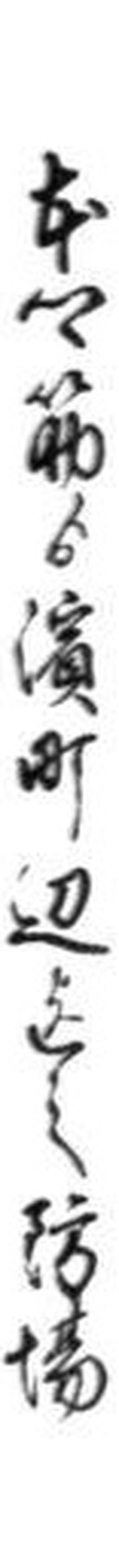本郷筋ゟ浜町迄之防場
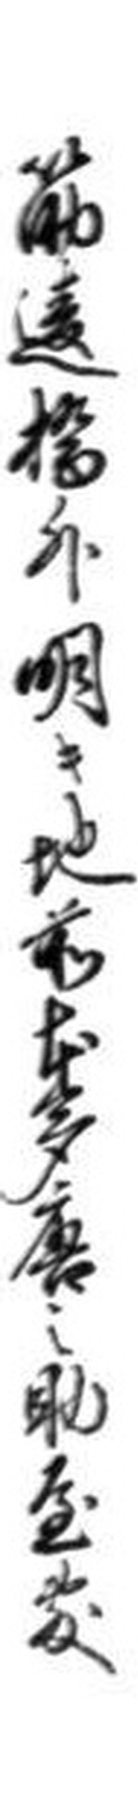筋違橋外明キ地前本多唐之助屋敷
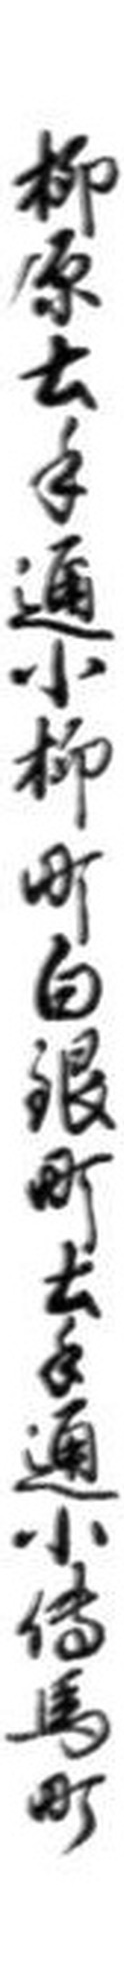柳原土手通小柳町白銀町土手通小伝馬町
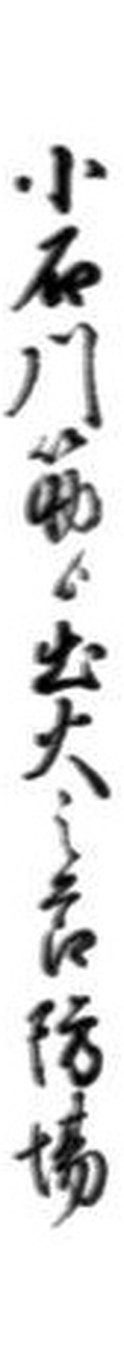小石川筋ゟ出火之節防場
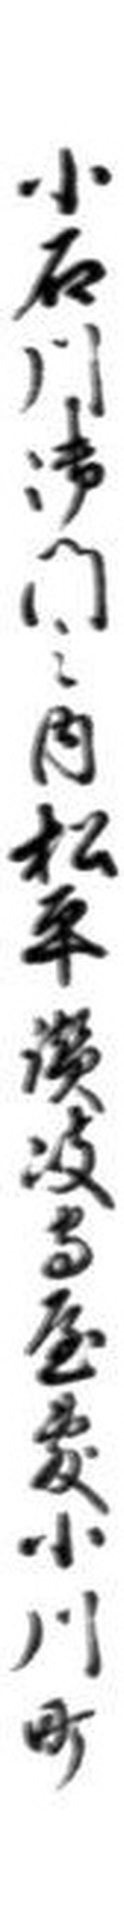小石川御門之内松平讃岐守屋敷小川町
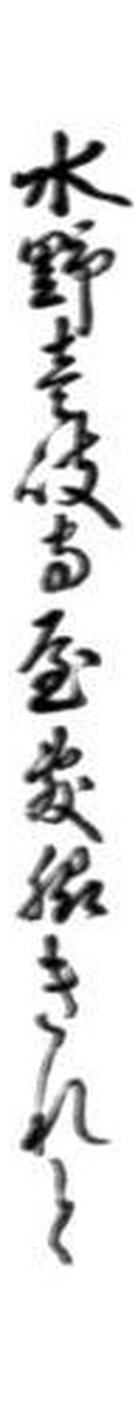水野壱岐守屋敷脇きれと
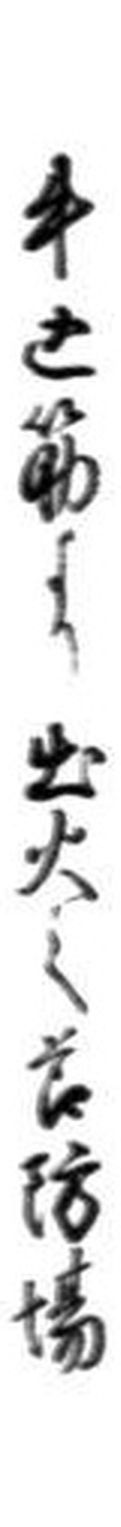牛込筋より出火之節防場
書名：家譜 三十二 吉邦公 従享保二年到享保三年
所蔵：福井県文書館 Fukui Prefectural Archives
